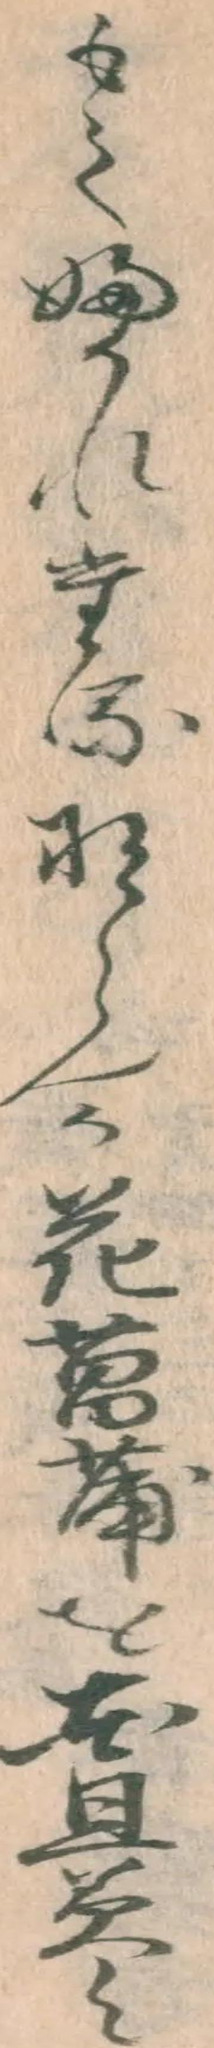もてふかれたるならんか花菖蒲を花且美と
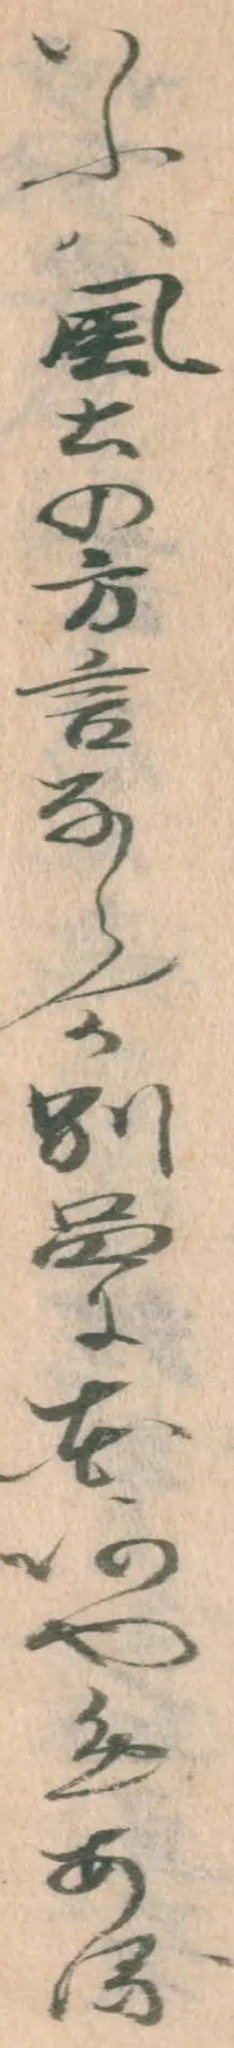いふハ風土の方言ならんか別品に花あやめある
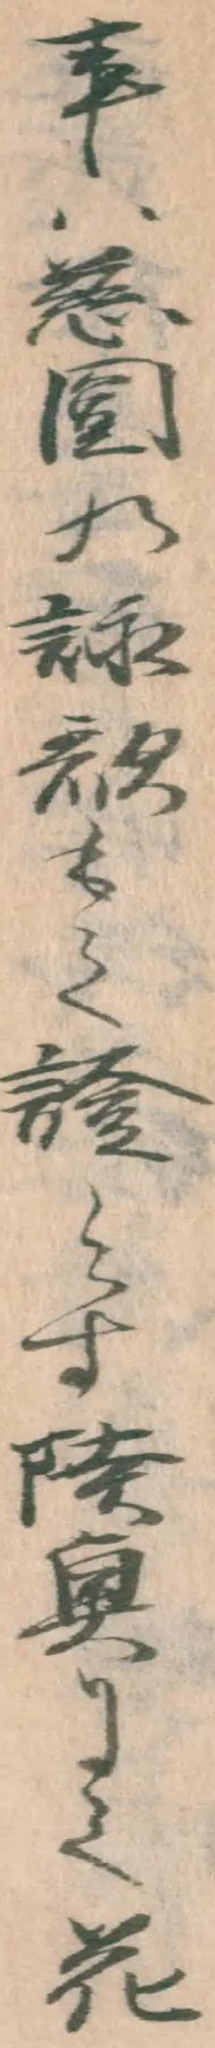事ハ慈円の詠歌もて升證と陸奥にて花
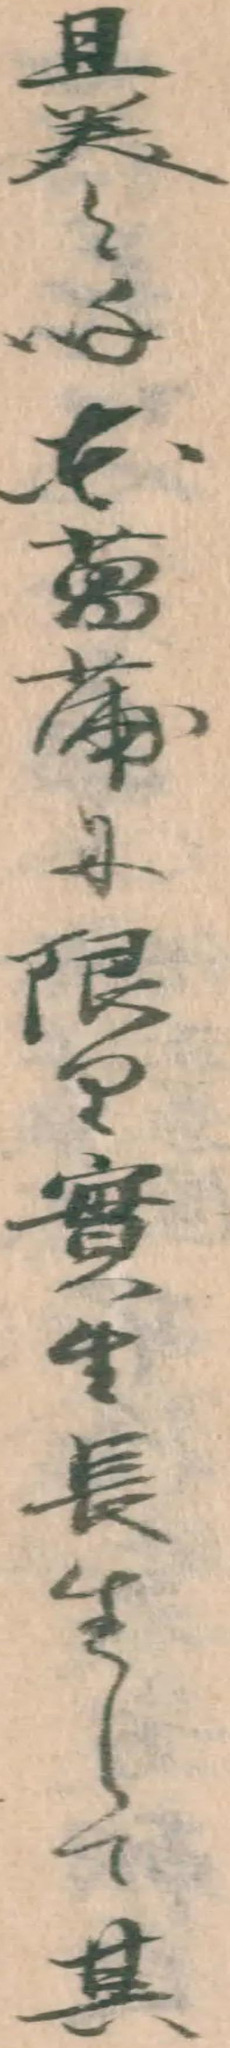且美と呼花菖蒲に限り実生長生して其
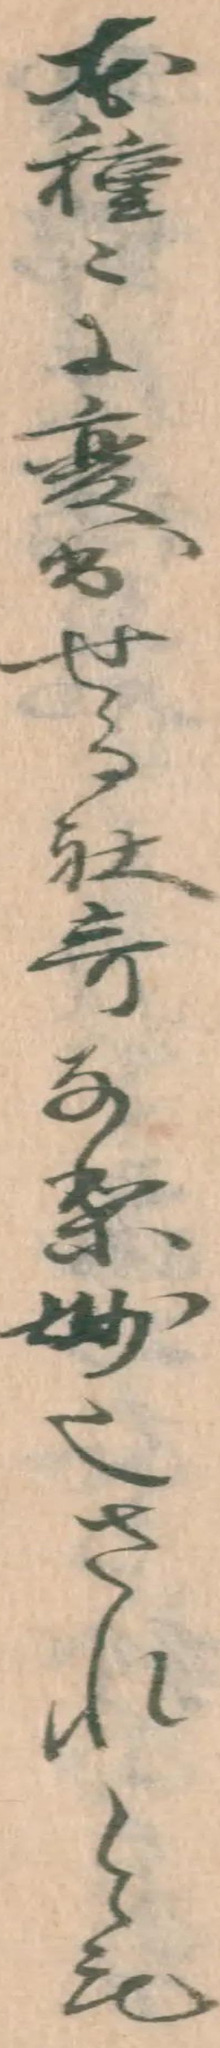本種とに変出せる社奇なり妙也されとも
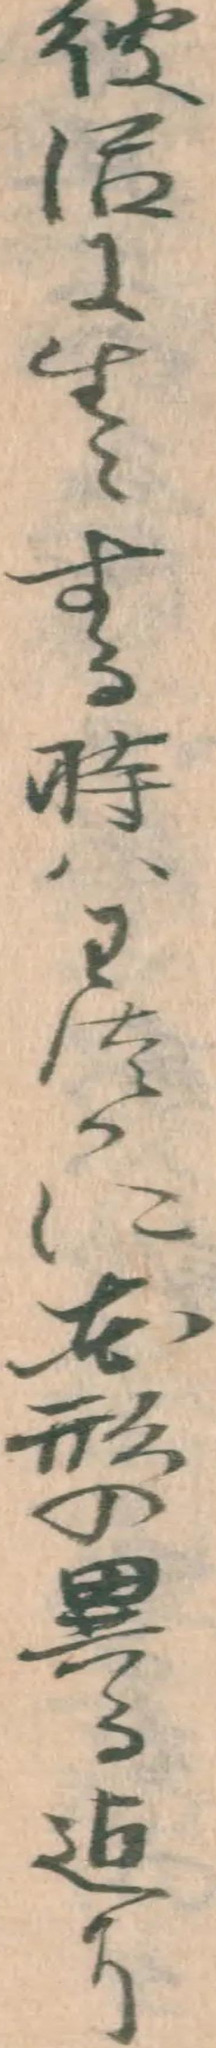彼沼に生々する時ハわすかに花形の異る迠に
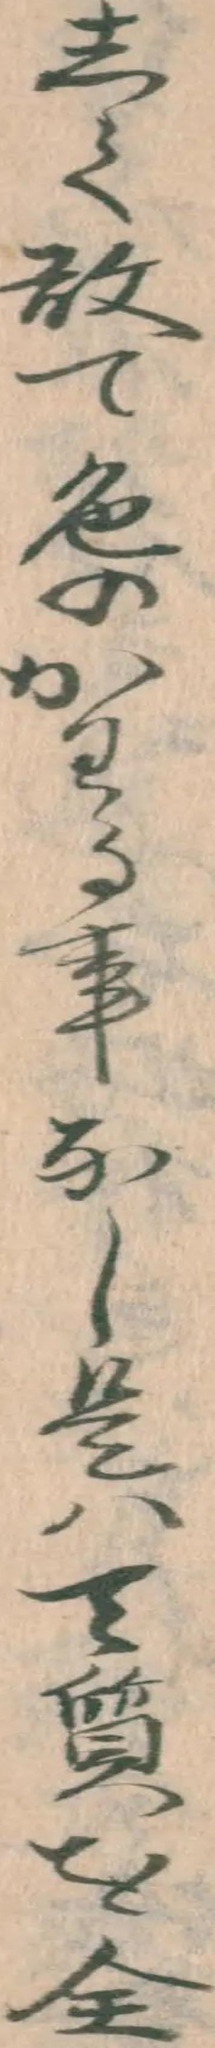して敢て色のかわる事なし是ハ天質を全
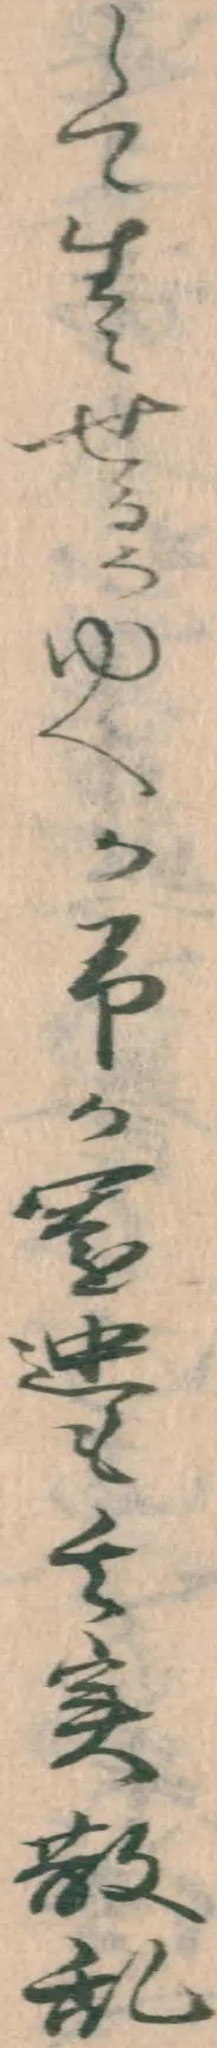して生々せるるゆへか予か還迚も其実散乱
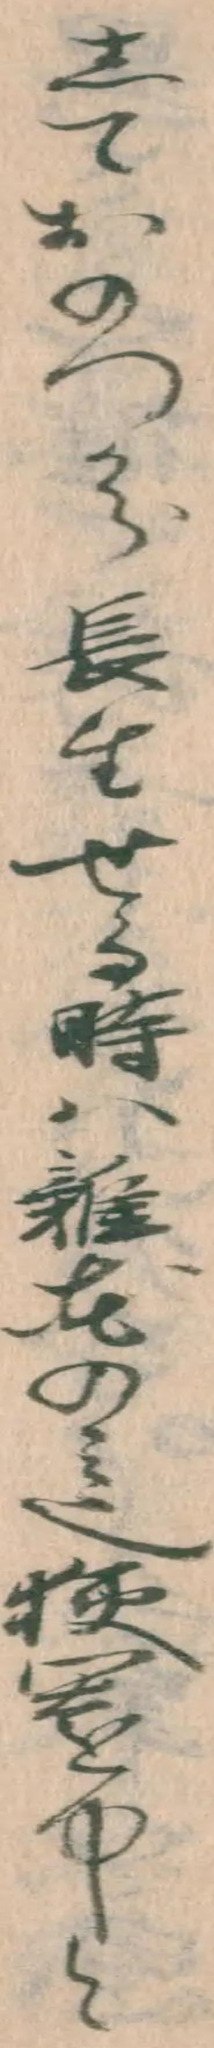しておのつから長生せる時ハ雑花のミ也狭園中と
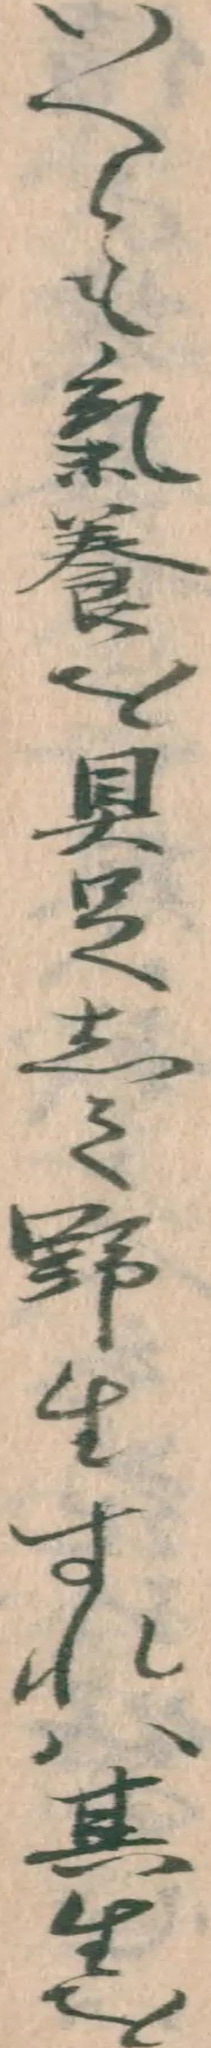いへとも気養を具足して野生すれハ其生を
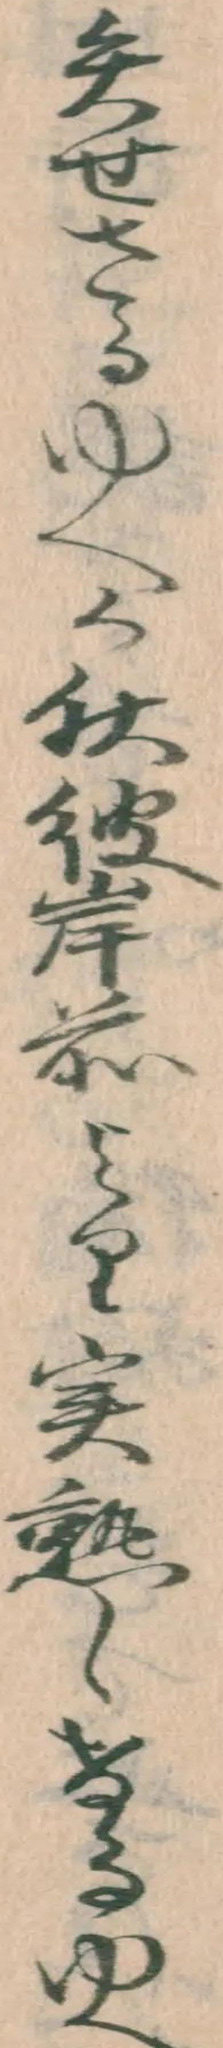失せさるゆへか秋彼岸前より実熟しけるゆへ
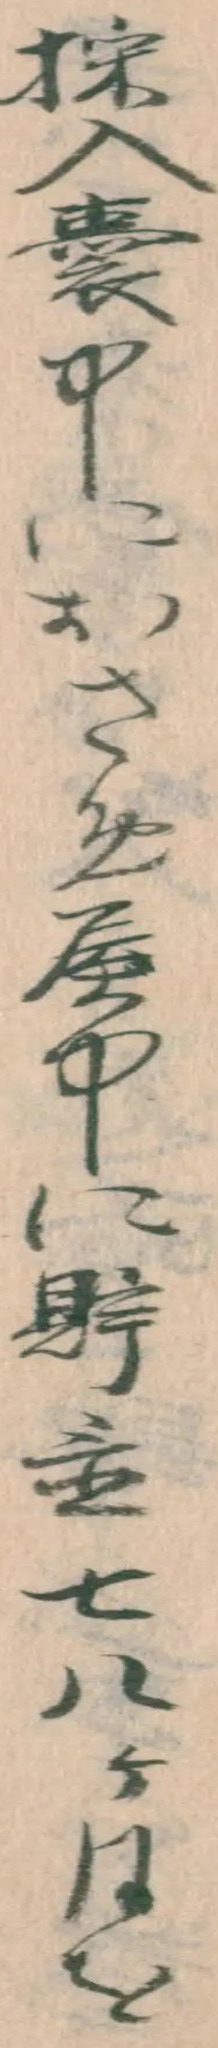採入嚢中におさめ屋中に貯置七八ヶ月を
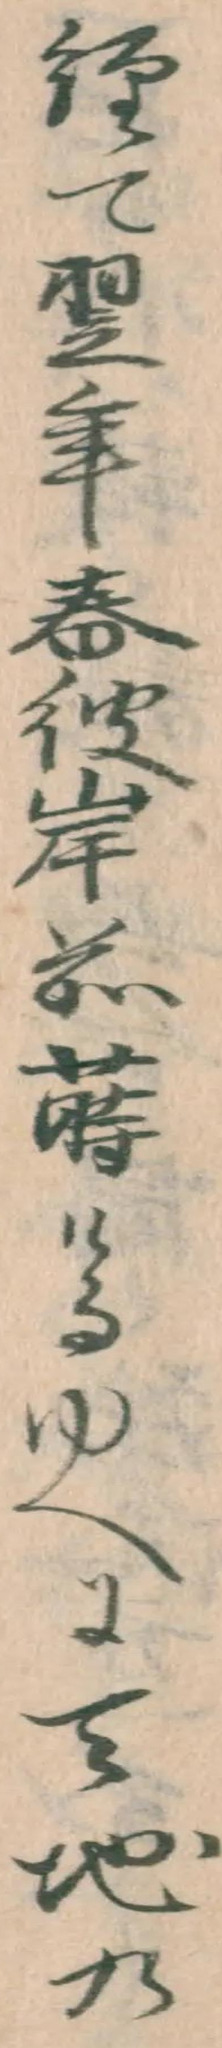経て翌年春彼岸前蒔けるゆへに天地の
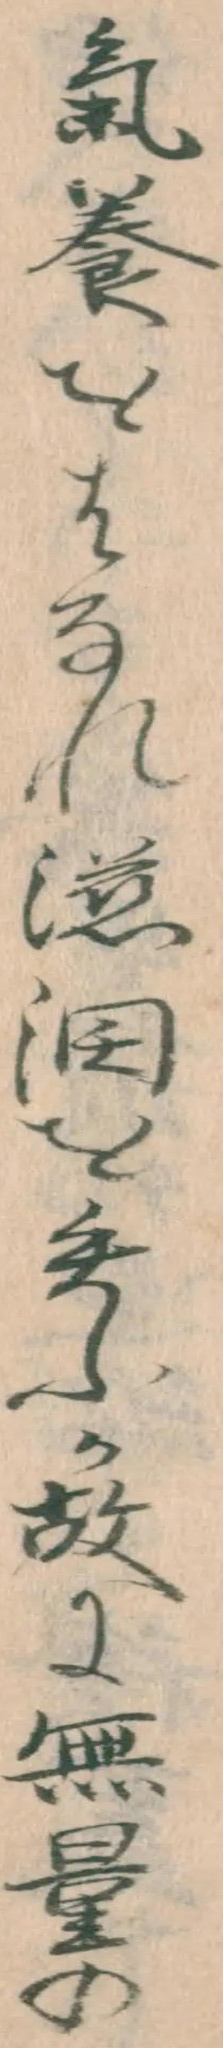気養をはなれ滋を失ふか故に無量の
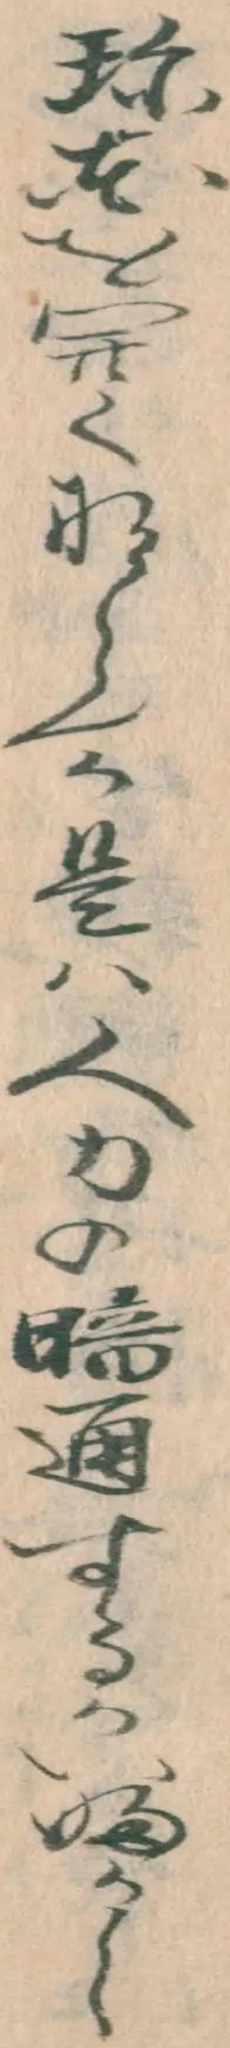珍花を開くならんか是ハ人力の暗通するかいふかし
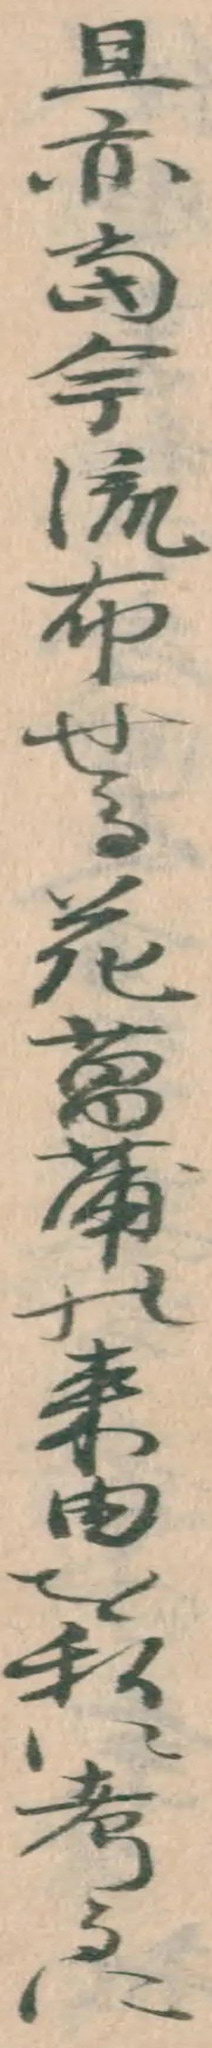且亦当今流布せる花菖蒲の来由を私に考るに
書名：花菖培養録
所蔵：国立国会図書館 National Diet Library, JAPAN
